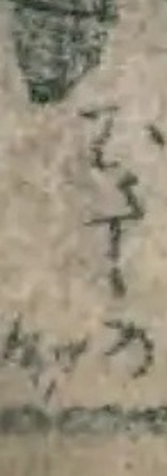むさしの
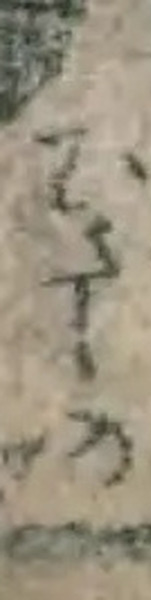むさしの
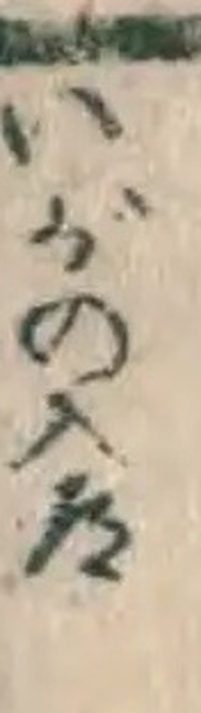いがの入道
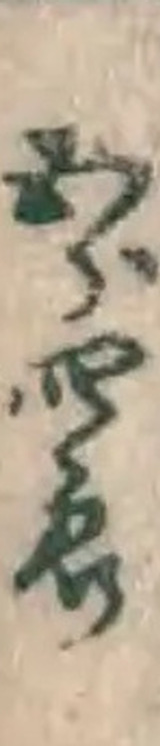五郎四郎

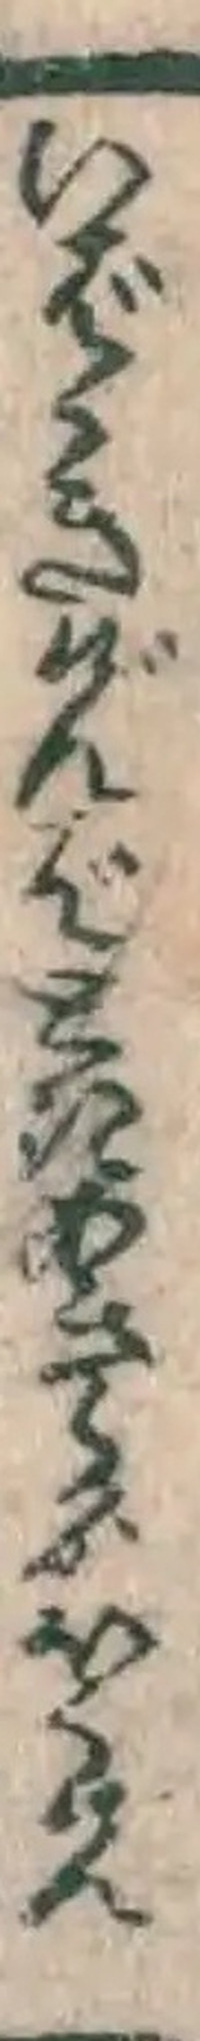いばらきげんばときあきらよりほうけん
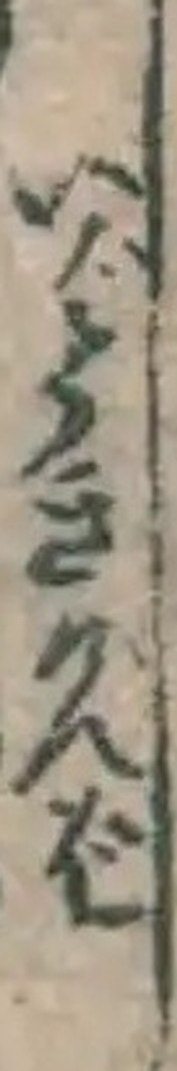いばらきげんば
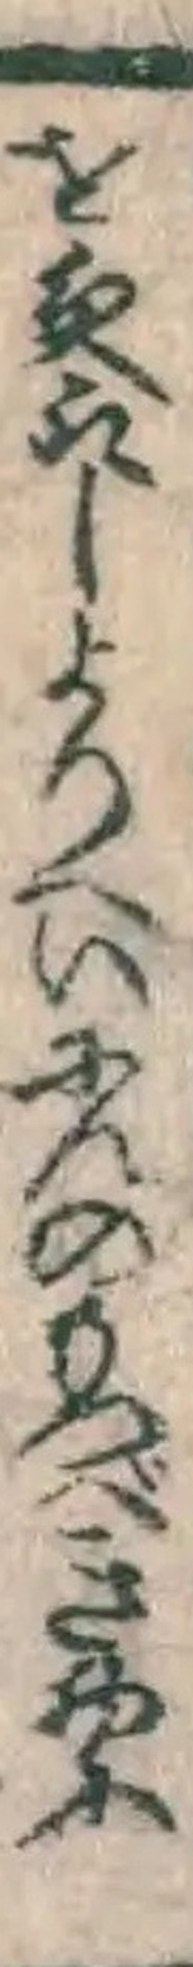を受取しよりへいにんのもつべき物に
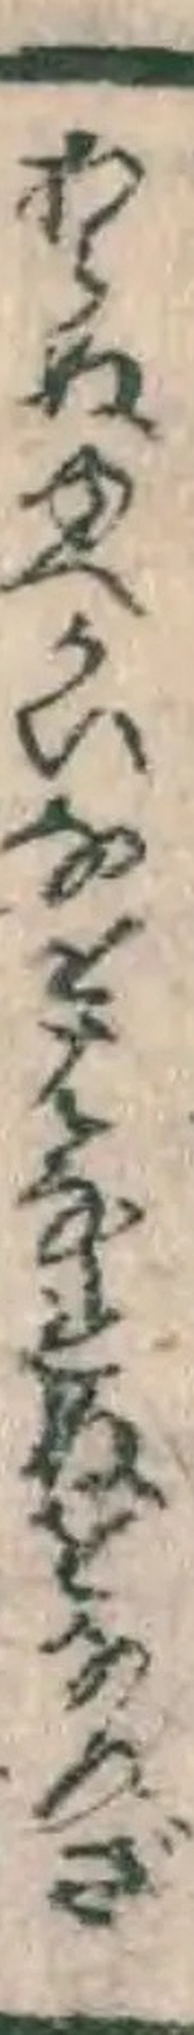あらぬゆへかいなをはなれぬをなんざ
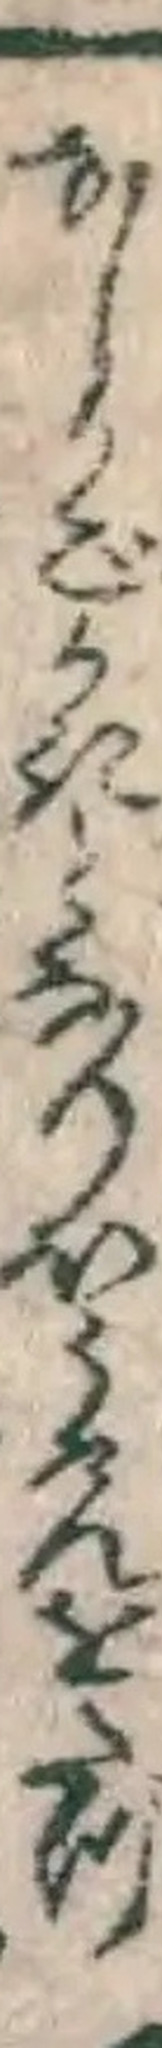なしかごかきとなりほうけんをたづ
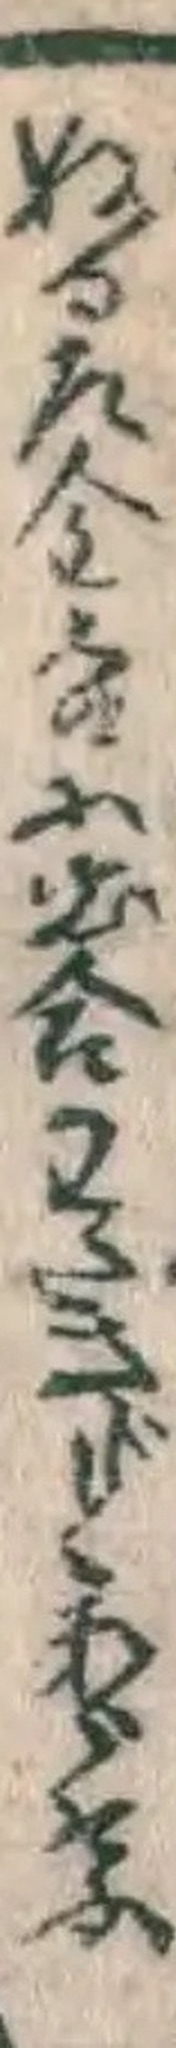ぬる左金吾に出合わたさじとあらそふ
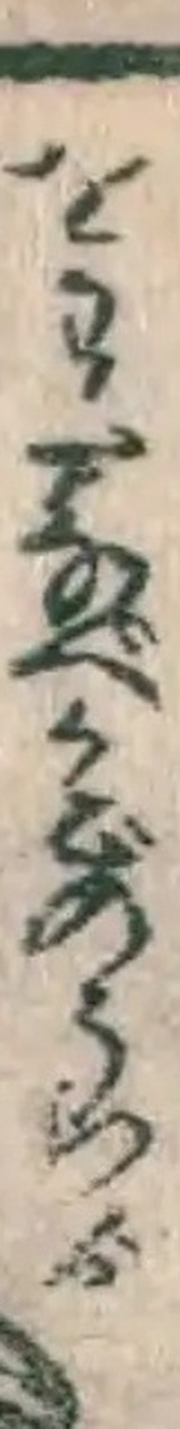をわたなべかごのうちより
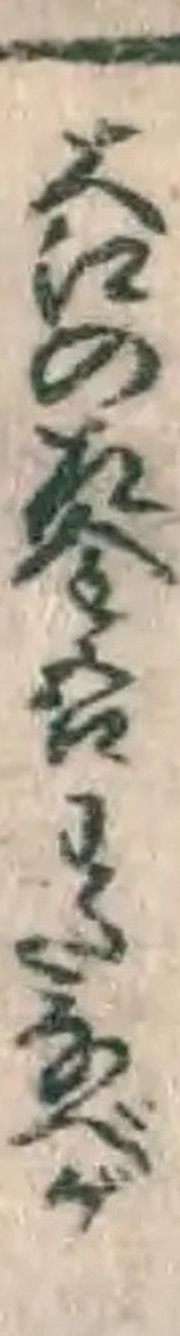大江の左金吾わたなべが
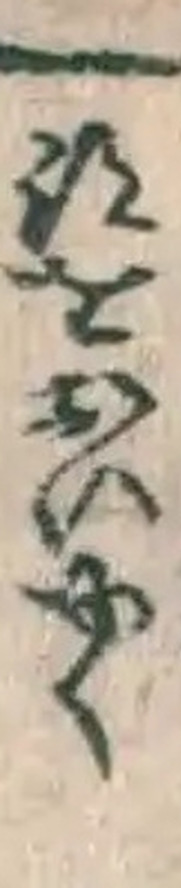跡をおいゆく
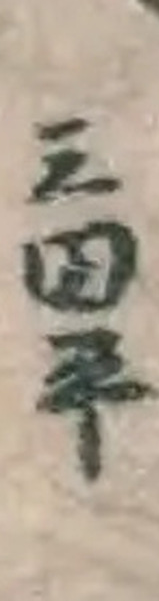三田平
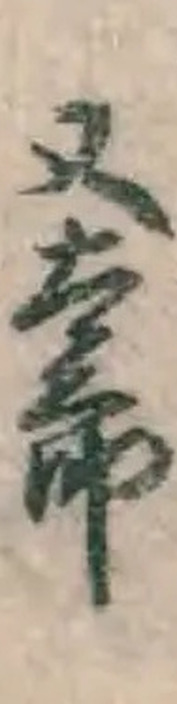又太郎
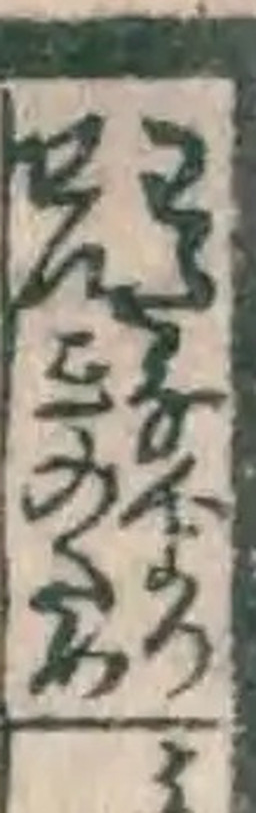せんきのため
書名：四天王宿直着綿
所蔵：国立国会図書館 National Diet Library, JAPAN
